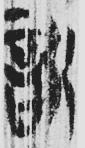訢
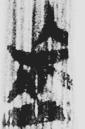者（諸）
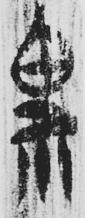○（鬼）
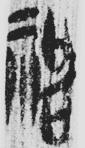神
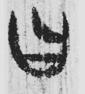曰
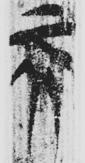天
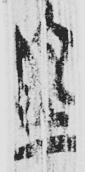○（地）
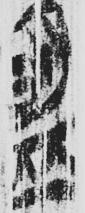盟（明）
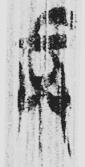弃
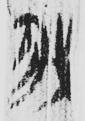我
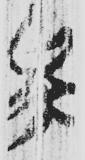矣
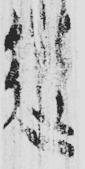近
